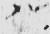八
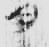月
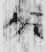癸
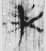未
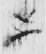之
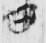日
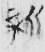新
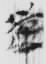游
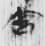宮
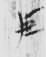𠁩
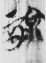諭
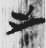之
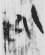州
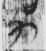加
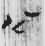公
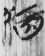弼
